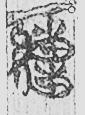{糸東田}
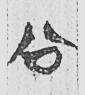公
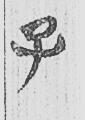子
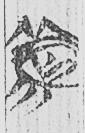義
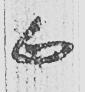㠯（以）
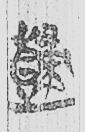歸
